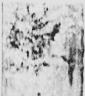東
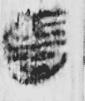周
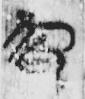客
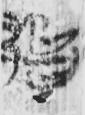○（許）
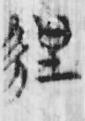○（盈）
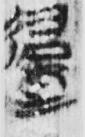歸
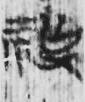祚（胙）
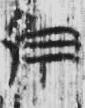於
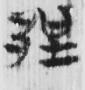郢
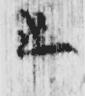之
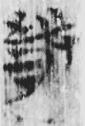歲（歲）
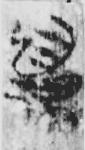○（夏）
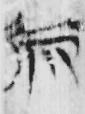𫵖
